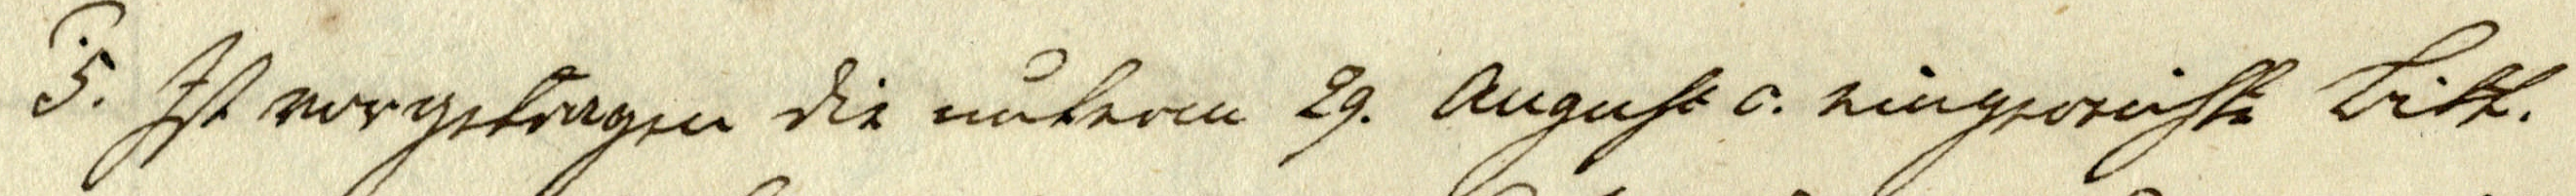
5. Ist vorgetragen die unterm 29. August c. eingereichte Bitt¬
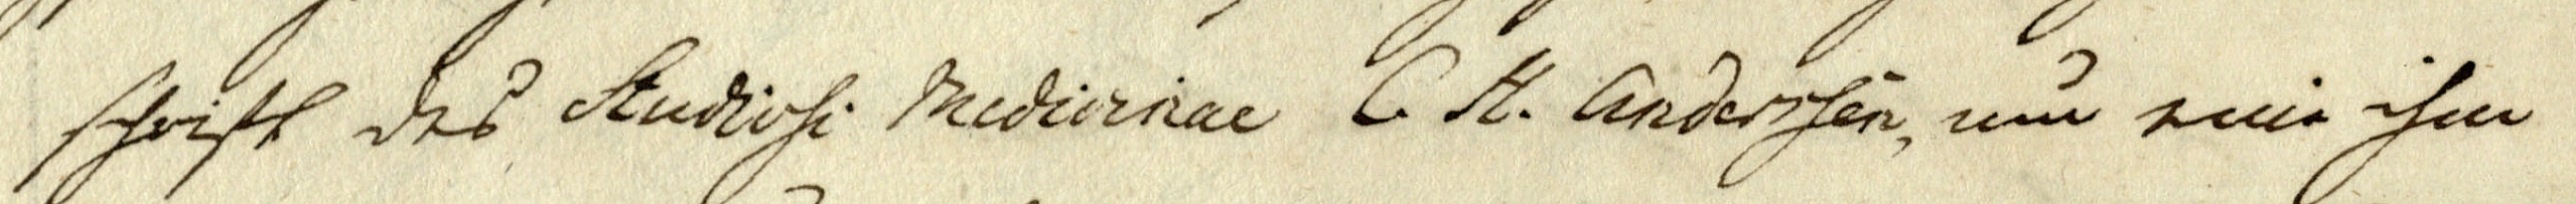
schrift des Studiosi Medicinae C. H. Anderssen, um eine ihm
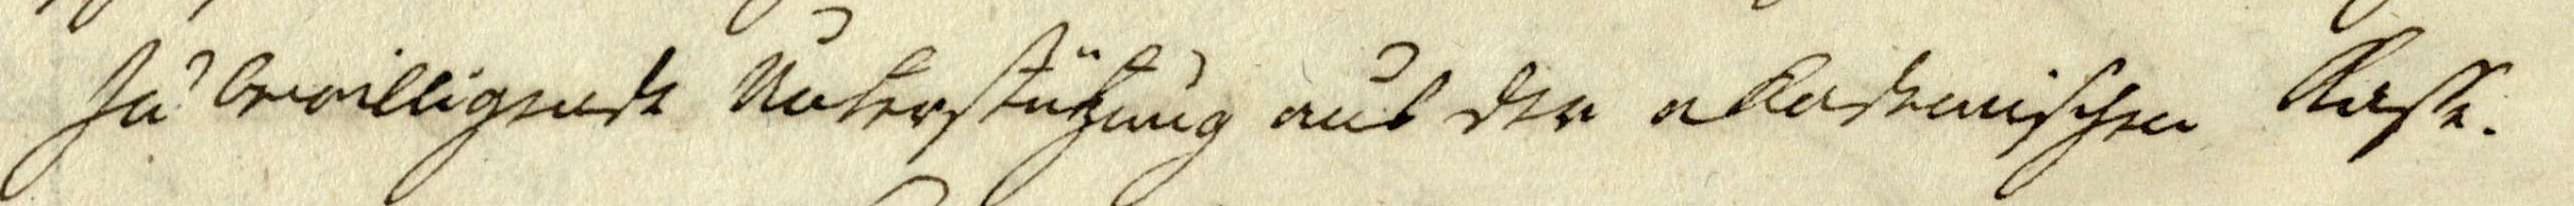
zu bewilligende Unterstützung aus der akademischen Kasse.
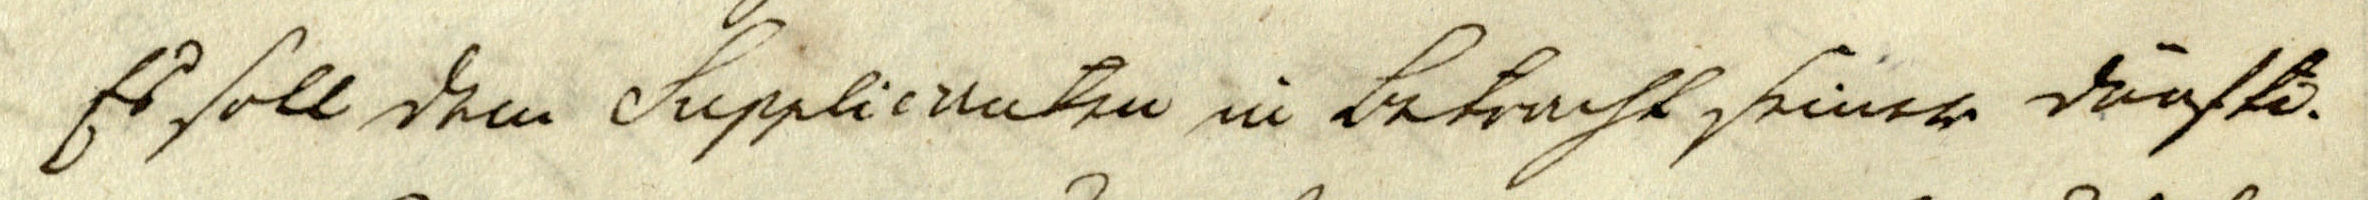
Es soll dem Supplicanten in Betracht seiner dürfti¬
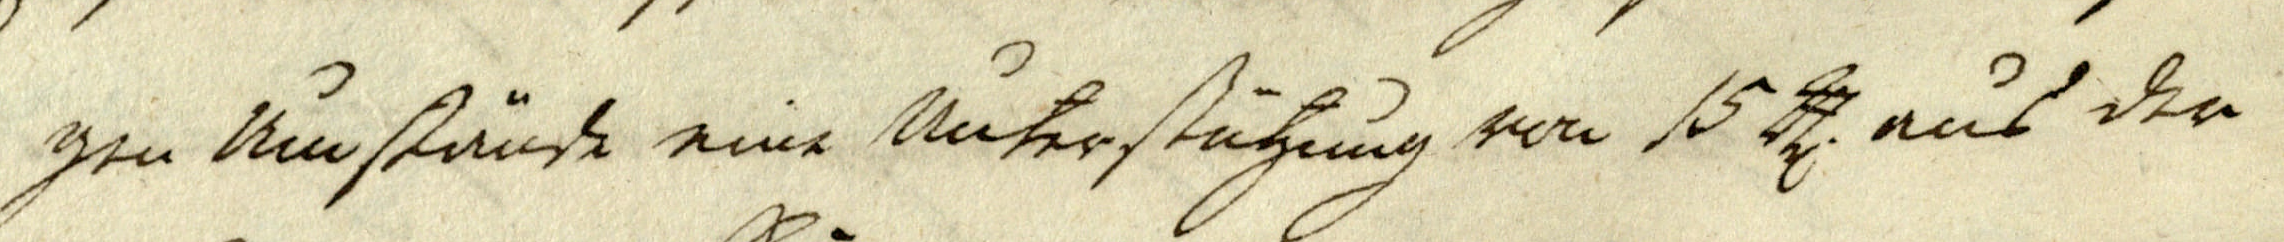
gen Umstände eine Unterstützung von 15 Rt. aus der
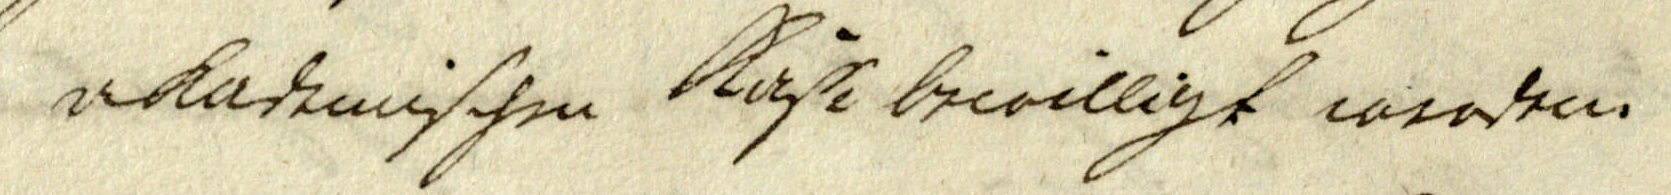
akademischen Kasse bewilligt werden.
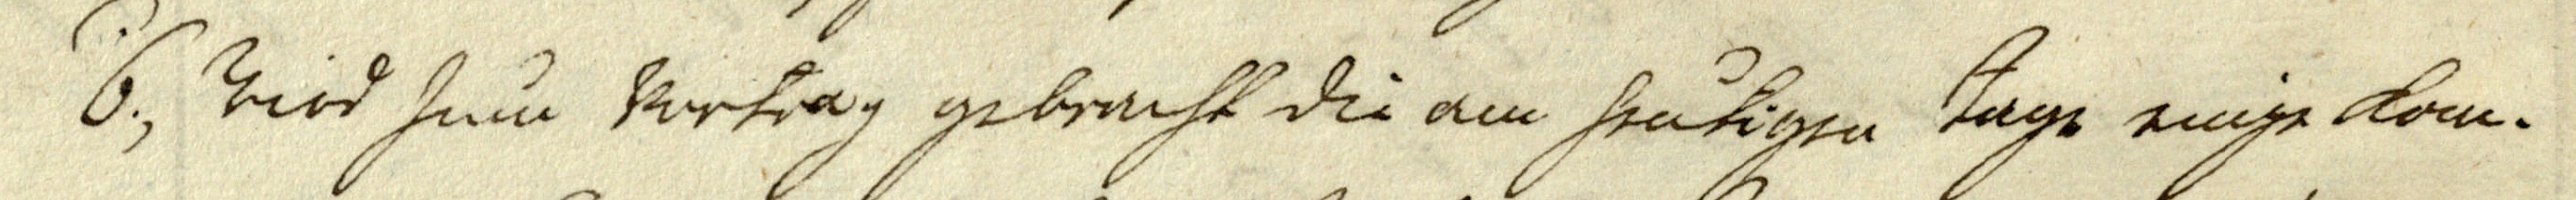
6., Wird zum Vortrag gebracht die am heutigen Tage eingekom¬
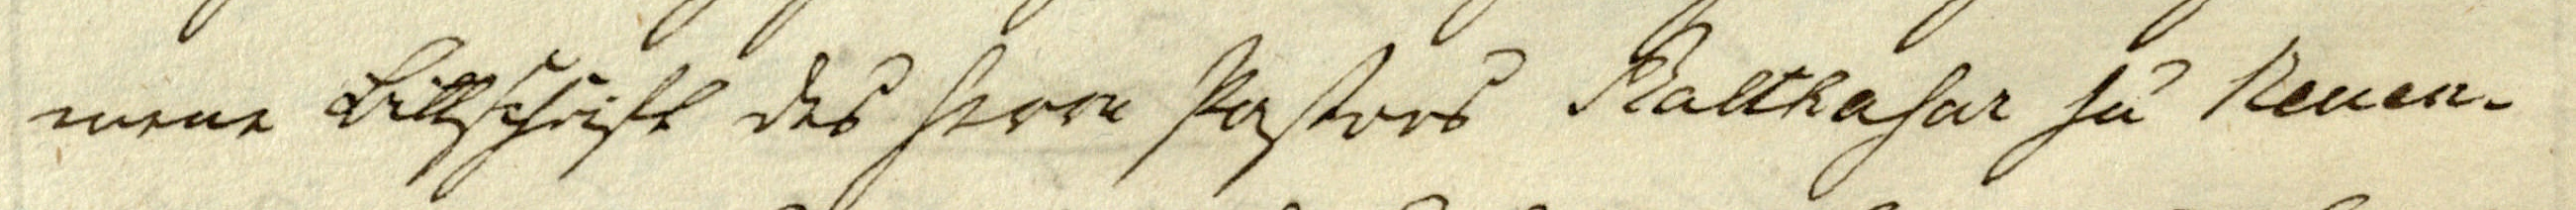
mene Bittschrift des Herrn Pastors Balthasar zu Neuen¬
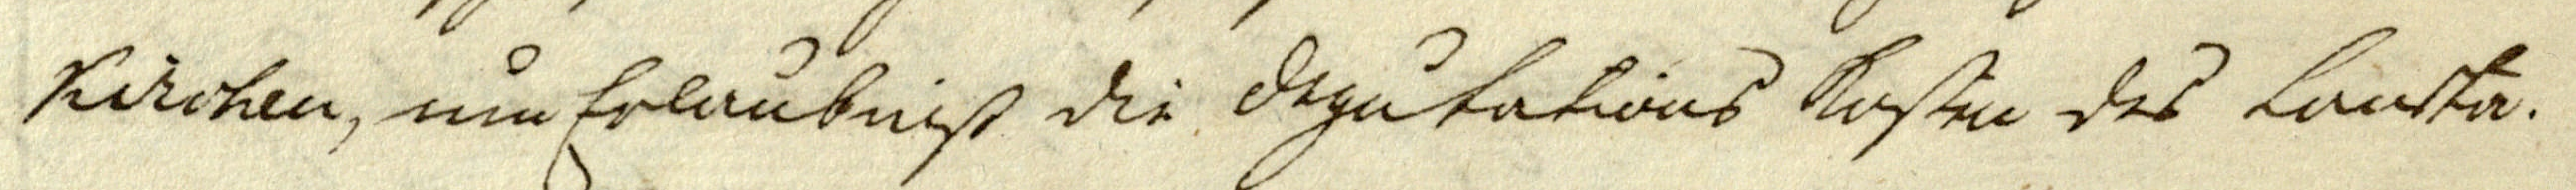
kirchen, um Erlaubnis die Deputations Kosten des Landta¬
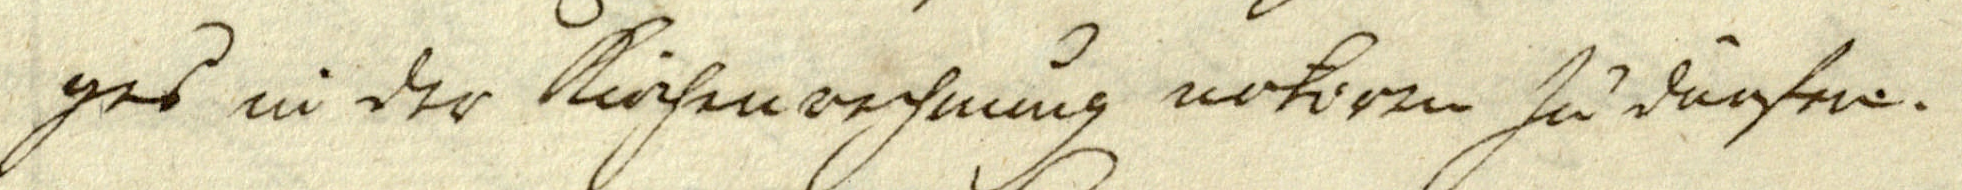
ges in der Kirchenrechnung notiren zu dürfen.
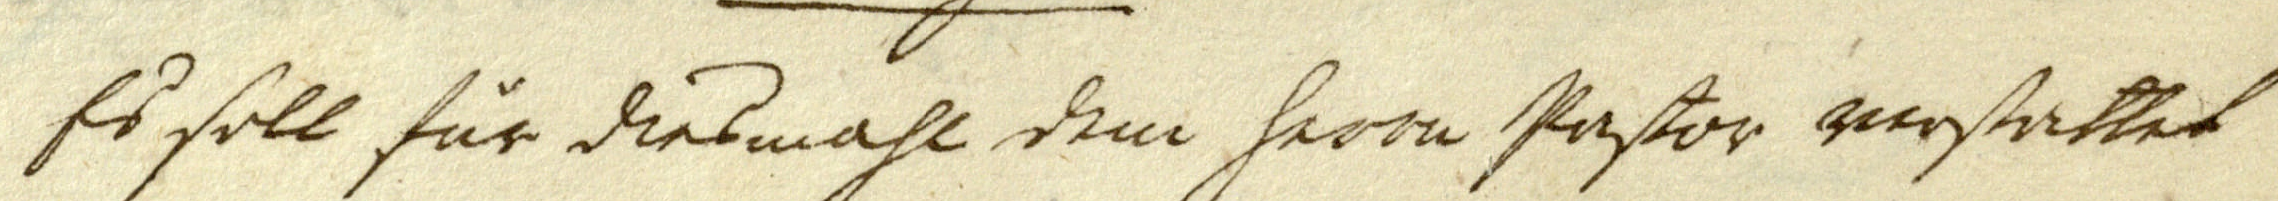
Es soll für diesmahl dem herrn Pastor verstattet
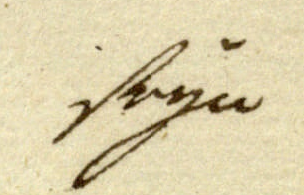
seÿn
